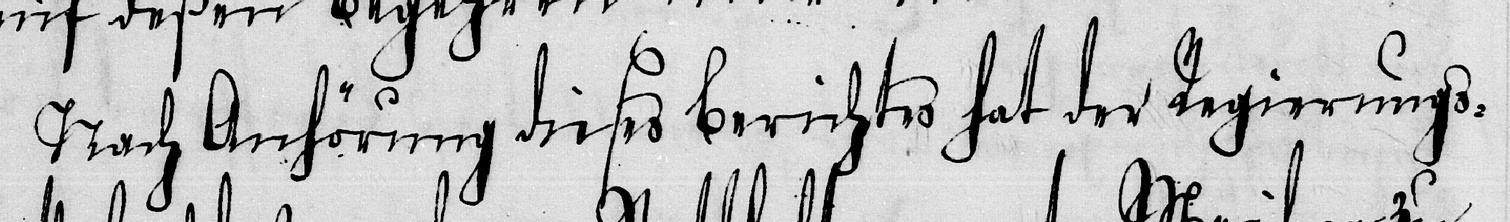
Nach Anhörung dieses Berichtes hat der Regierungs¬
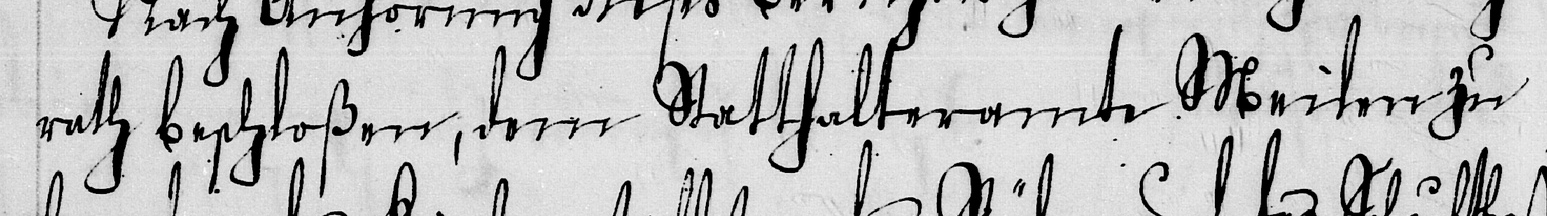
rath beschloßen, dem Statthalteramte Meilen zu
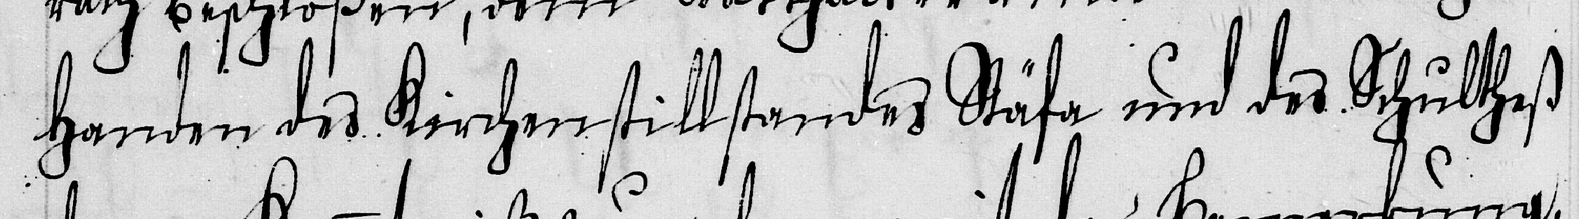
Handen des Kirchenstillstandes Stäfa und des Schultheß
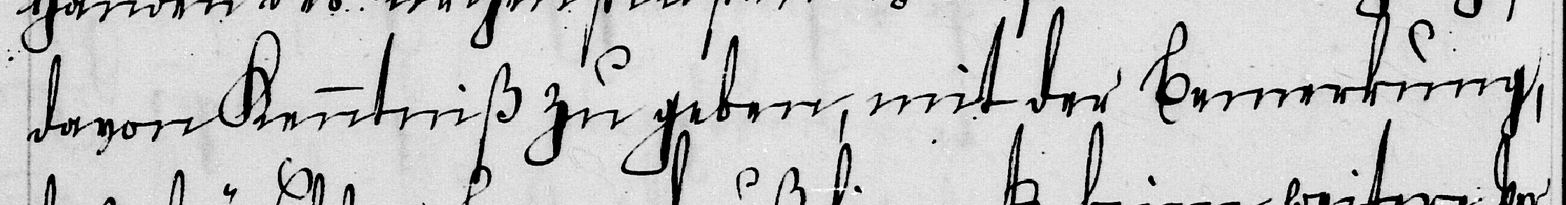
davon Kenntniß zu geben, mit der Bemerkung,
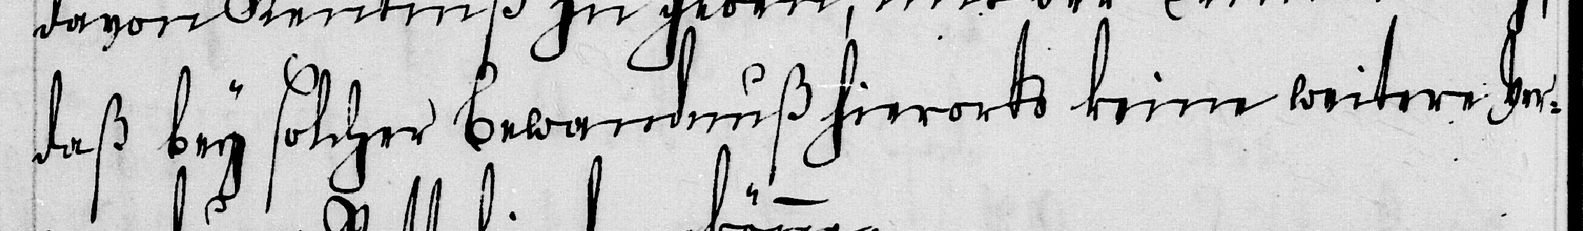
daß bey solcher Bewandnuß hierorts keine weitere Ver¬
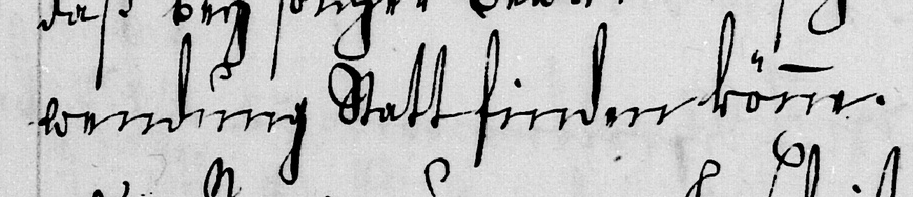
wendung Statt finden könne.
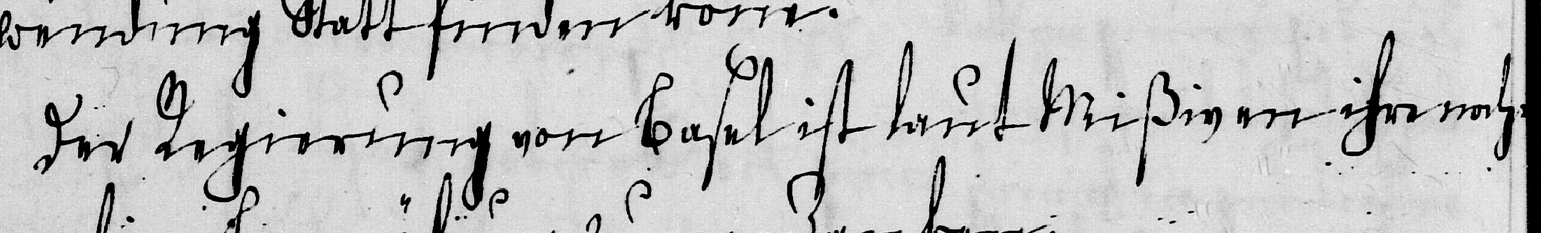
Der Regierung von Basel ist laut Mißiven ihre noc¬
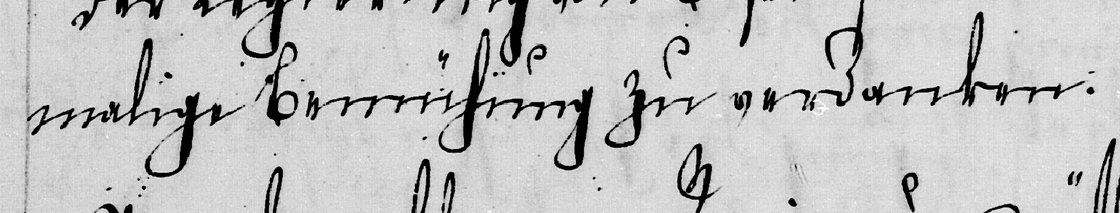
hmalige Bemühung zu verdanken.
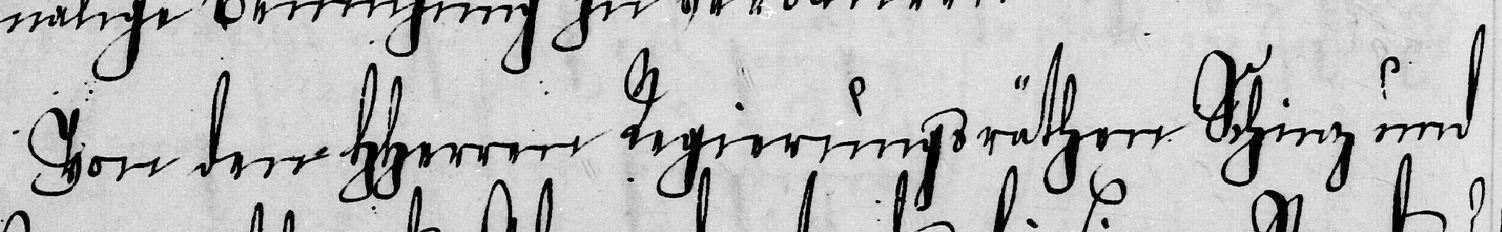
Von den HHerrn Regierungsräthen Schinz und
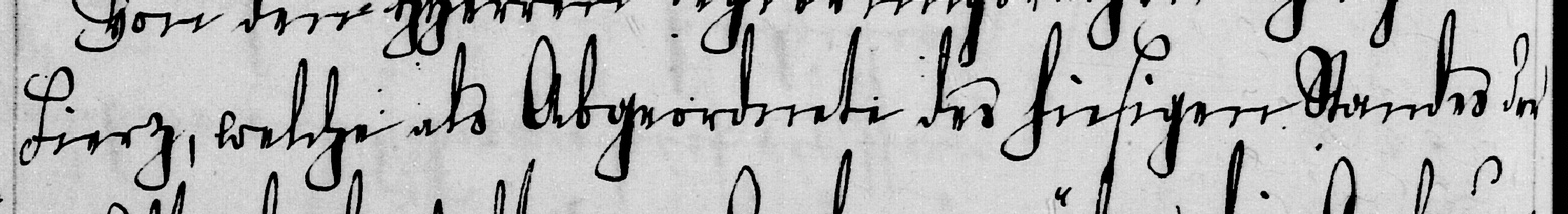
Fierz, welche als Abgeordnete des hiesigen Standes der
